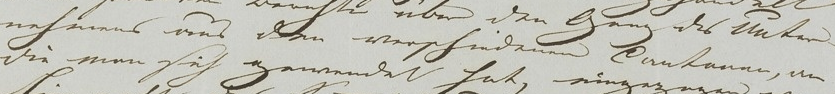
nehmens aus den verschiedenen Cantonen, an
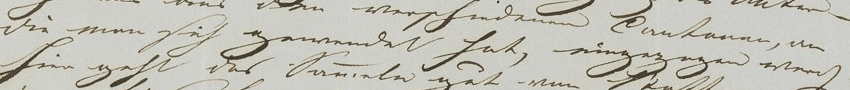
die man sich gewendet hat, eingezogen werden. -
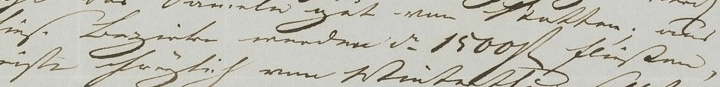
hies. Bezirke werden d. 1500 F fließen,
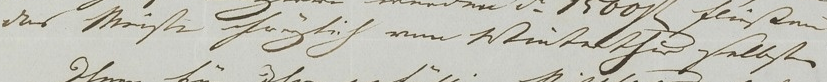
das Meiste freylich von Winterthur selbst.
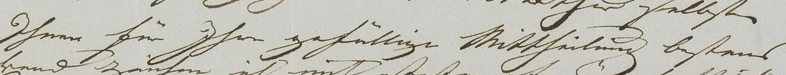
Ihnen für Ihre gefällige Mittheilung bestens
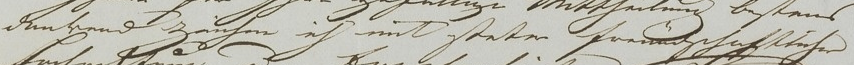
dankend zeichne ich mit steter freundschaftlicher
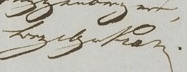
Huggenberger,
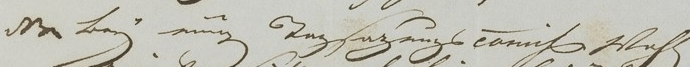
NB Bey eurer Tagsazungscommiß. Wahl
